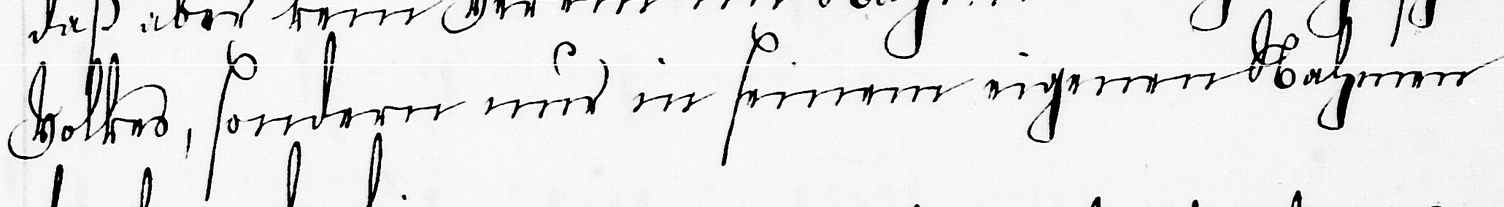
Volkes, sondern nur in seinem eigenen Nahmen
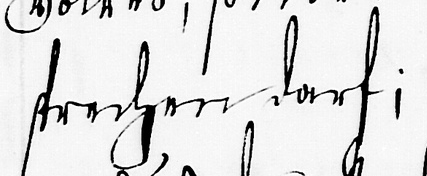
sprechen darf;
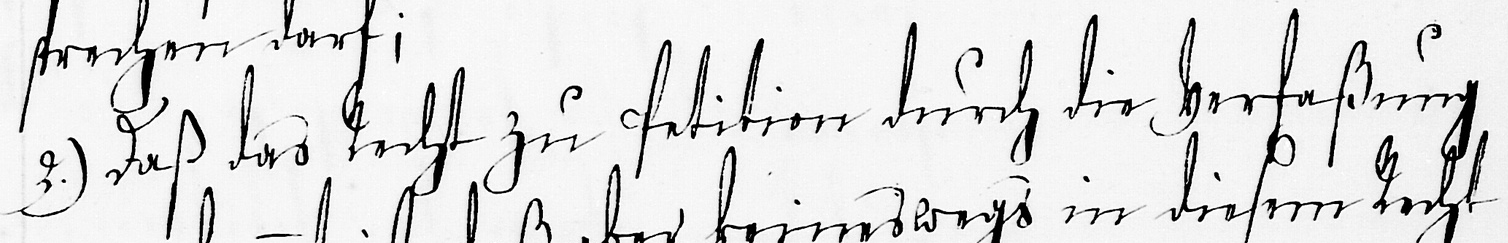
2.) Daß das Recht zu Petition durch die Verfaßung
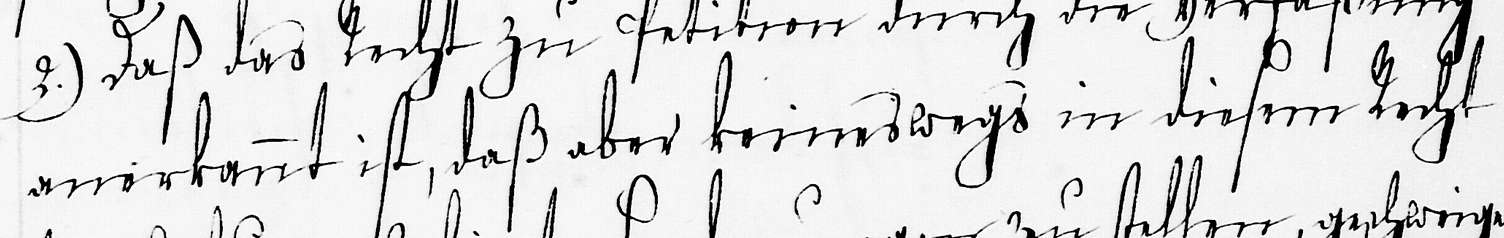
anerkannt ist, daß aber keineswegs in diesem Recht
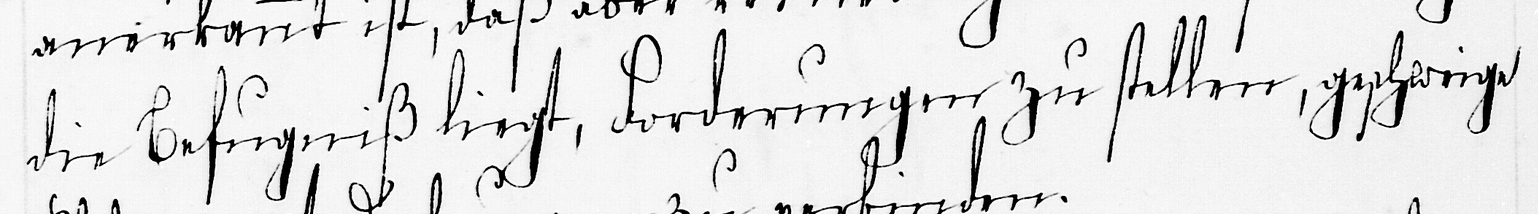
die Befugniß liegt, Forderungen zu stellen, geschwei¬
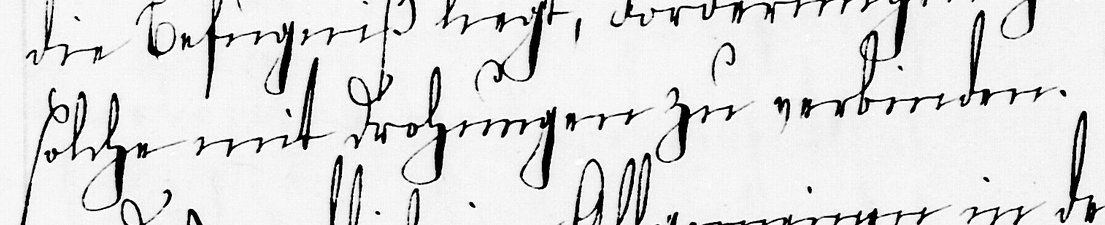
solche mit Drohungen zu verbinden.
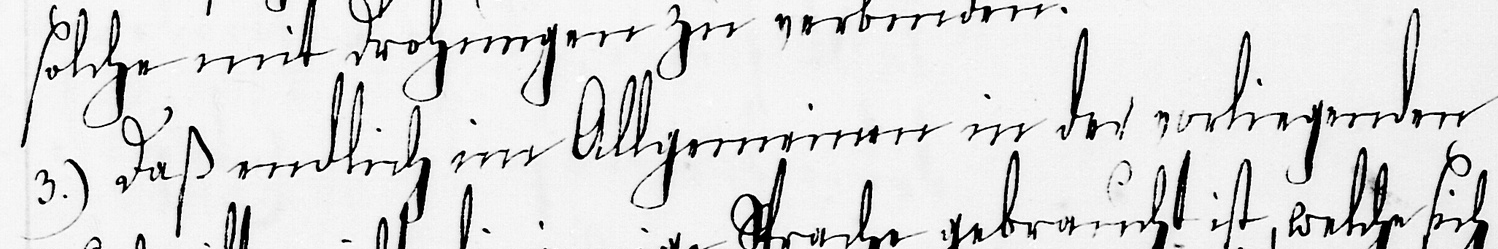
3.) Daß endlich im Allgemeinen in der vorliegenden
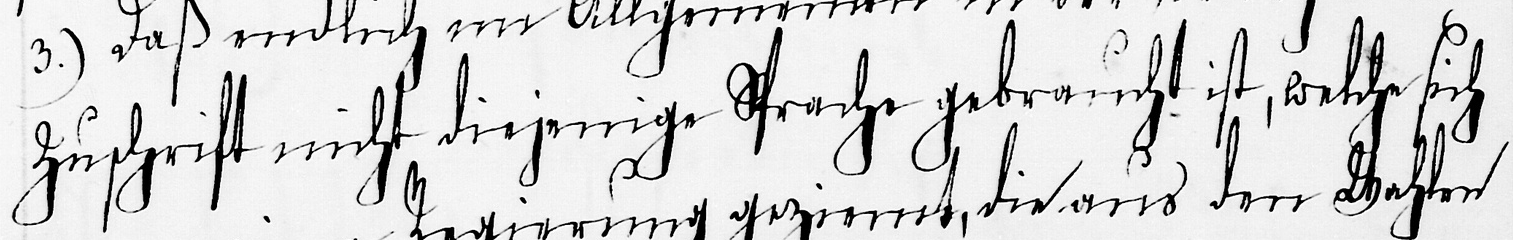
Zuschrift nicht diejenige Sprache gebraucht
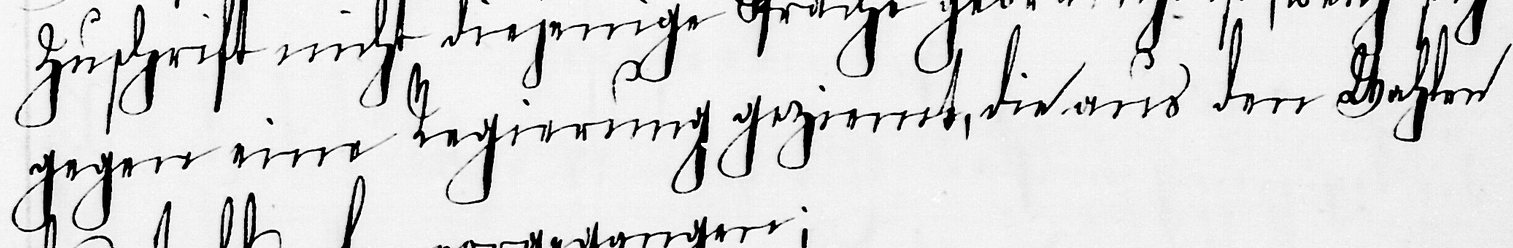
gegen eine Regierung geziemt, die aus den Wahlen
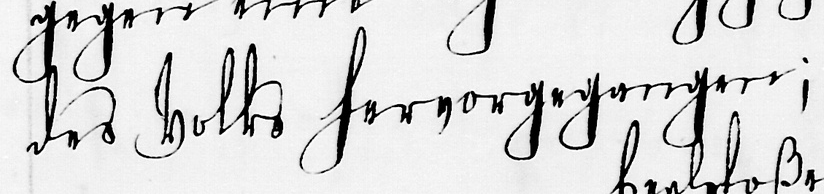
des Volks hervorgegangen;
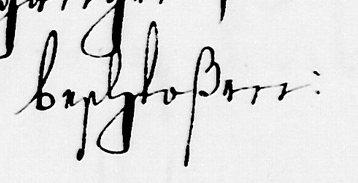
beschloßen:
